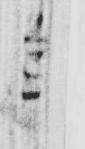必
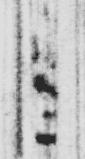悲
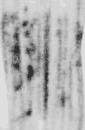哭
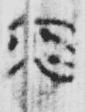亦
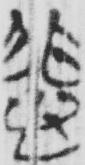悲
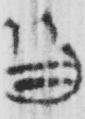皆
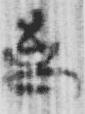至
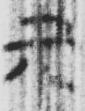亓（其）
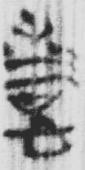情
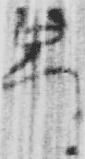也
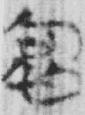哀
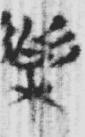○（樂）
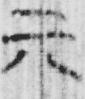亓（其）
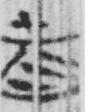眚（性）
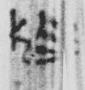相
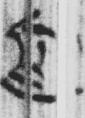近
